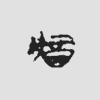將
